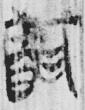○（聞）
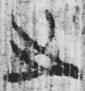之
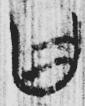曰
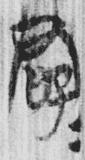子君
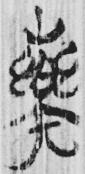藥（樂）
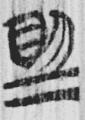則
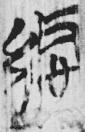○（治）
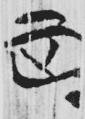正（政）
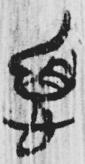○（憂）
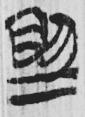則（則）
